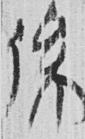係（由）
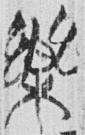樂
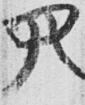四
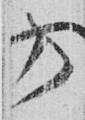方
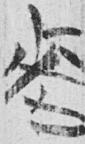○（來）
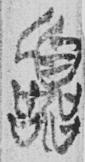囂
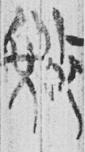敓（奪）
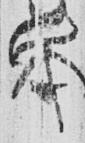民
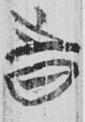○（時）
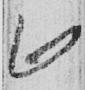㠯（以）
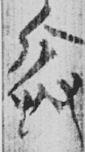兵
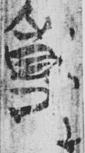事
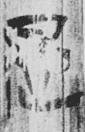是
